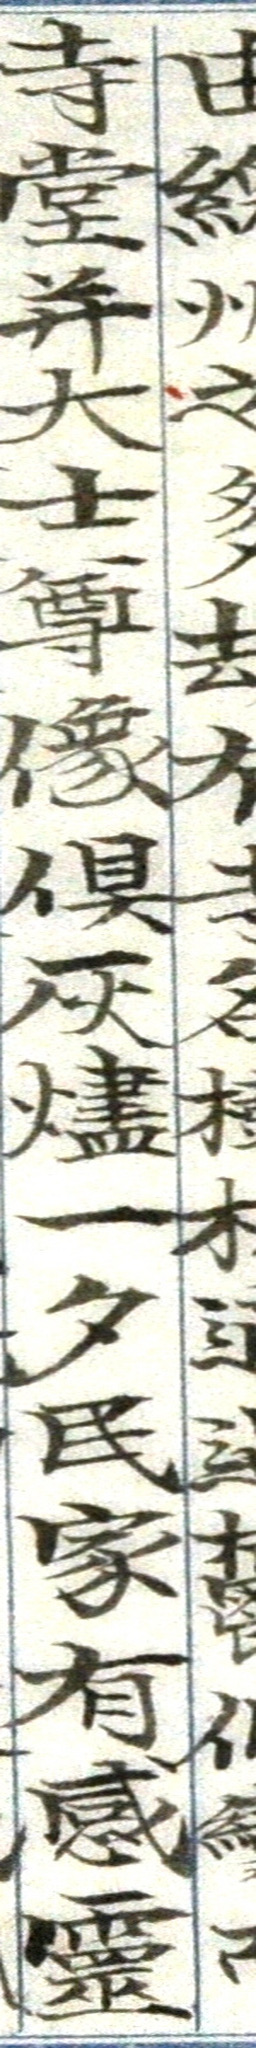寺堂并大士尊像倶灰燼一夕民家有感霊
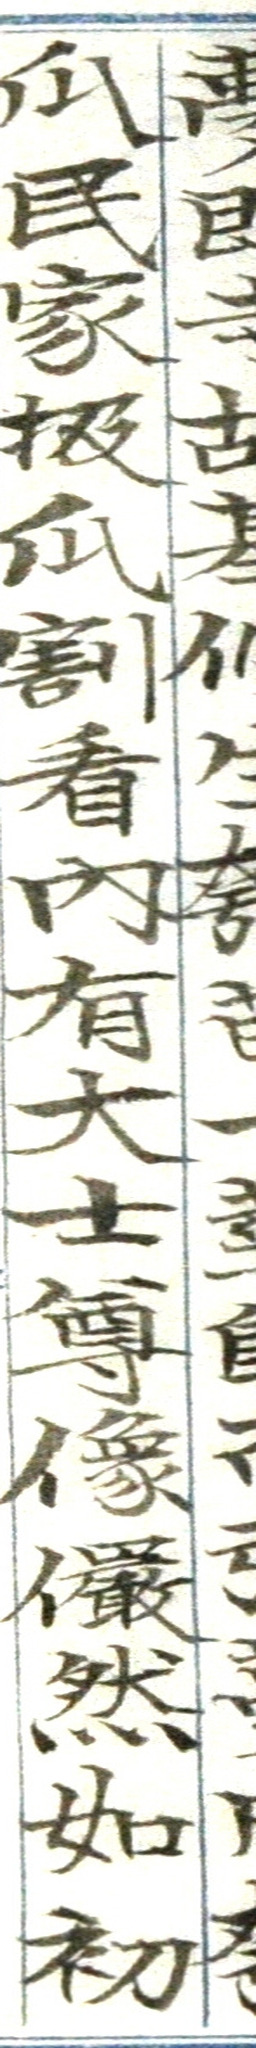瓜民家扱瓜割看内有大士尊像儼然如初
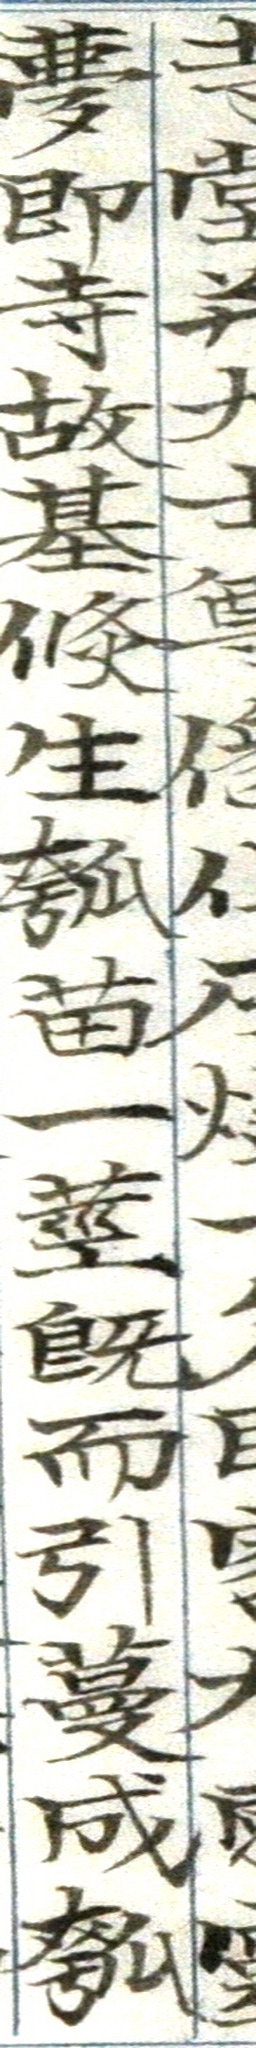夢即寺故基倐生瓠苗一茎既而引蔓成瓠

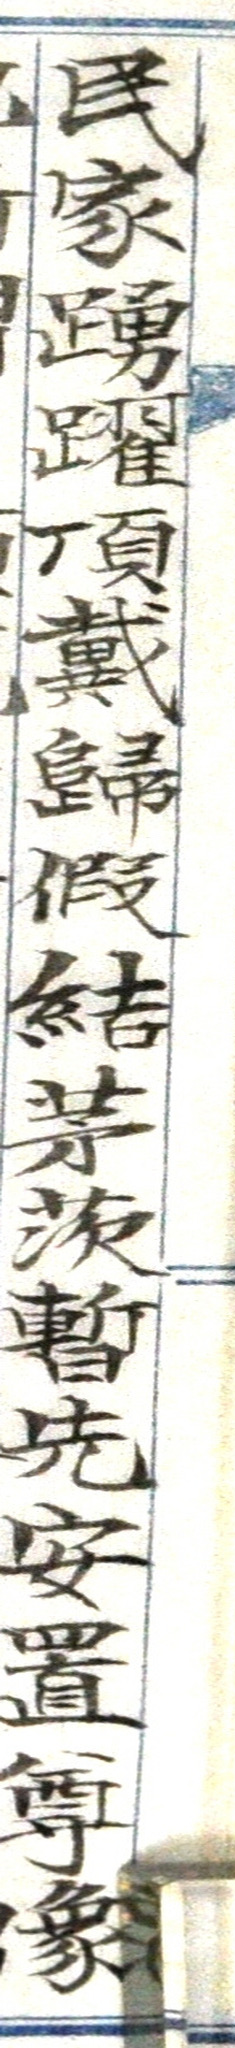民家踴躍頂戴帰仮結芽茨暫先安置尊像
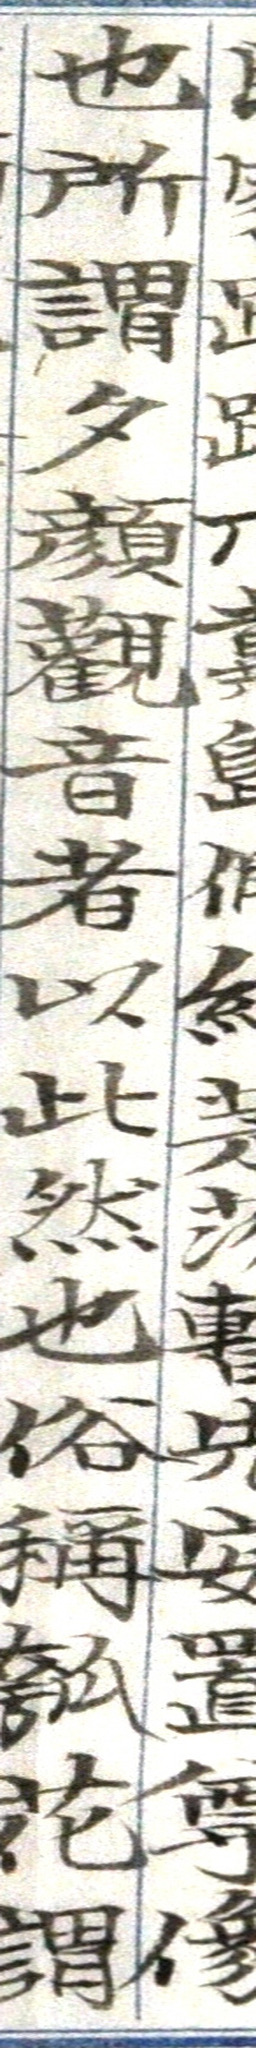也所謂夕顔観音者以此然也俗称瓠花謂
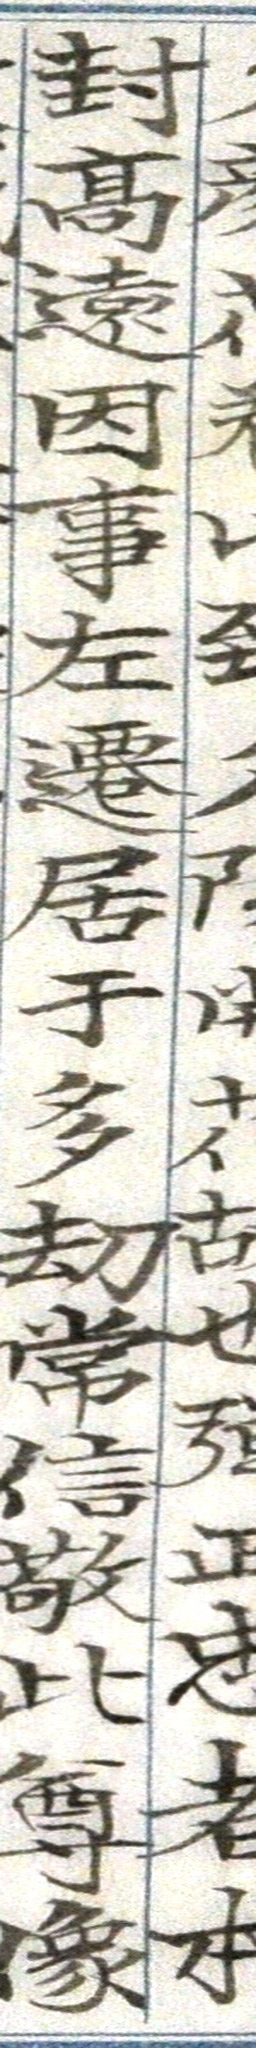封高遠因事左遷居于多刧常信敬此尊像
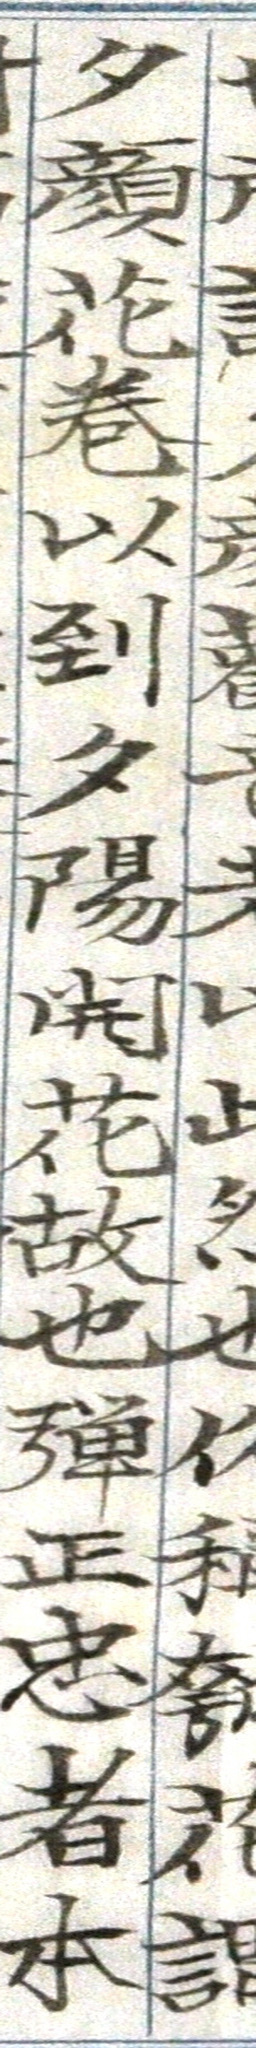夕顔花巻以到夕陽開花故也弾正忠者本
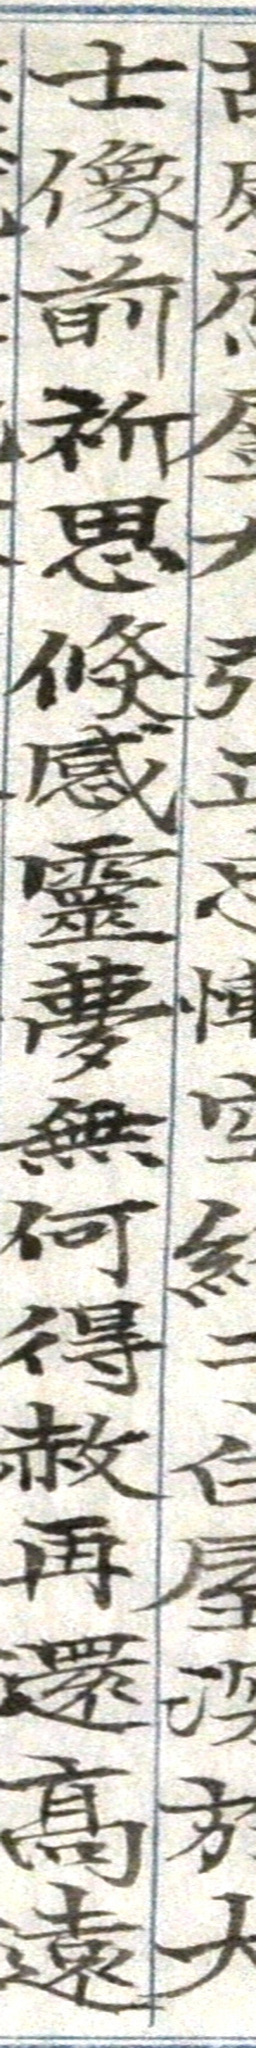士像前祈思倐感霊夢無何得赦再還高遠
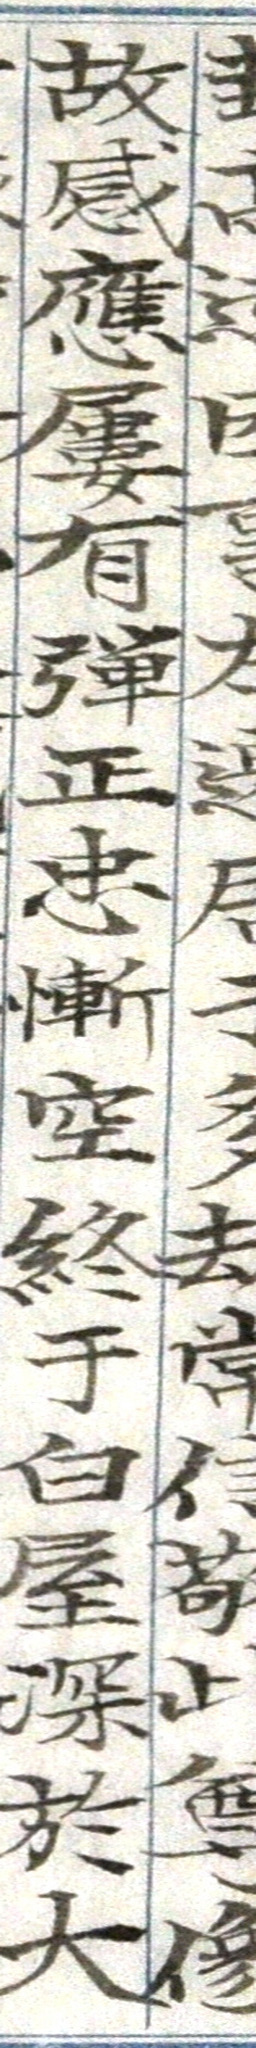故感応屡有弾正忠慚空終于白屋深於大
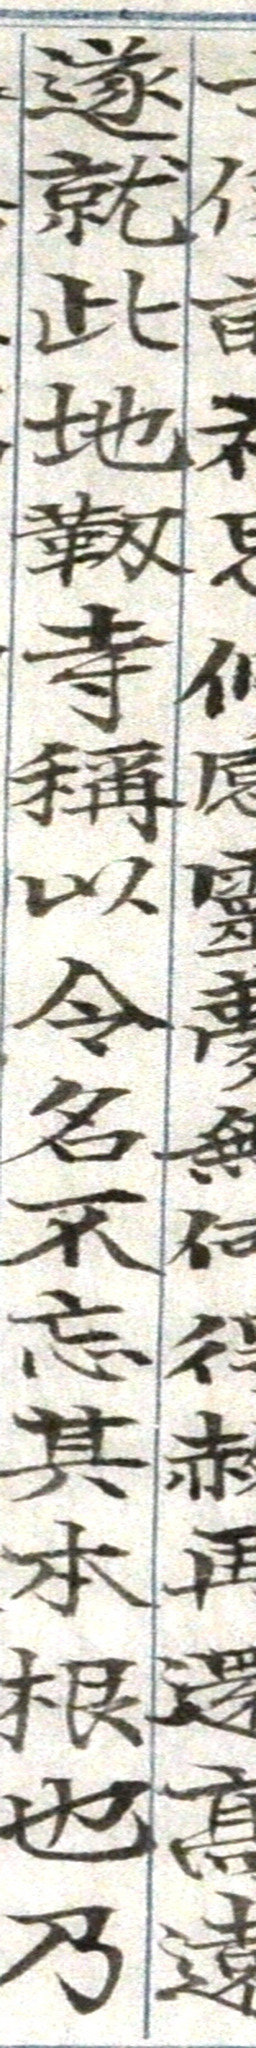遂就此地靭寺称以令名不忘其本根也乃
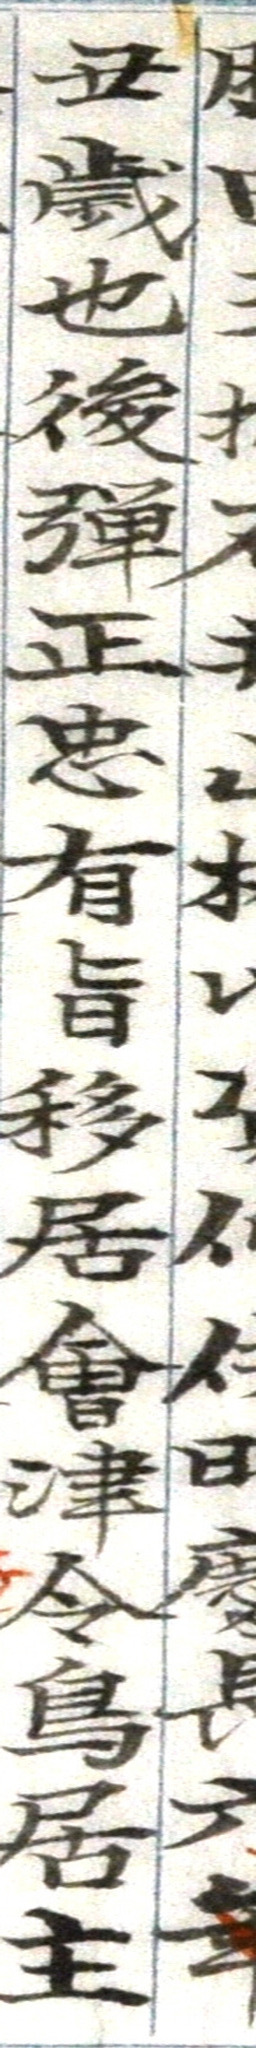丑歳也後弾正忠有旨移居会津令鳥居主
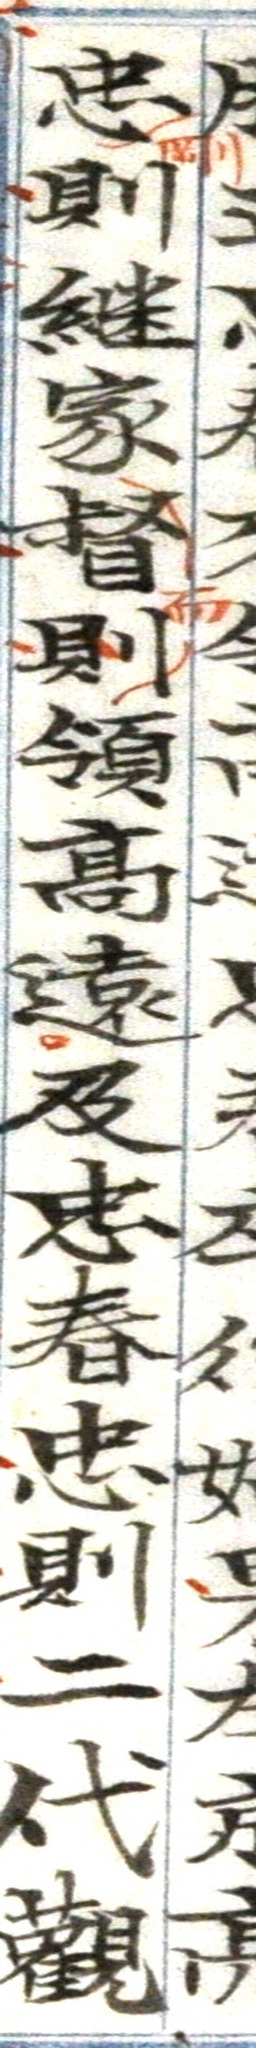忠則継家督而則領高遠及忠春則二代観
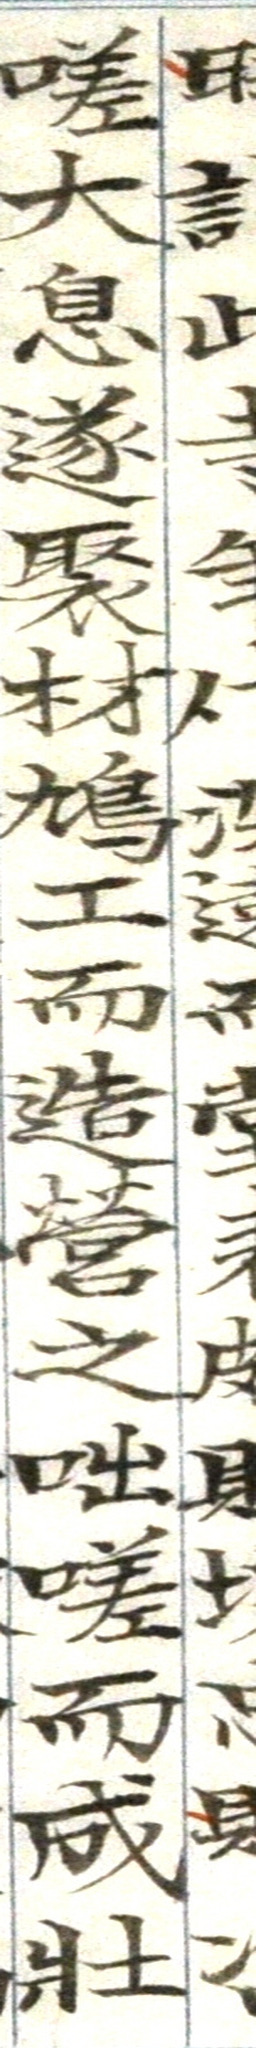嗟大息遂聚材鳩工而造営之咄嗟而成壮
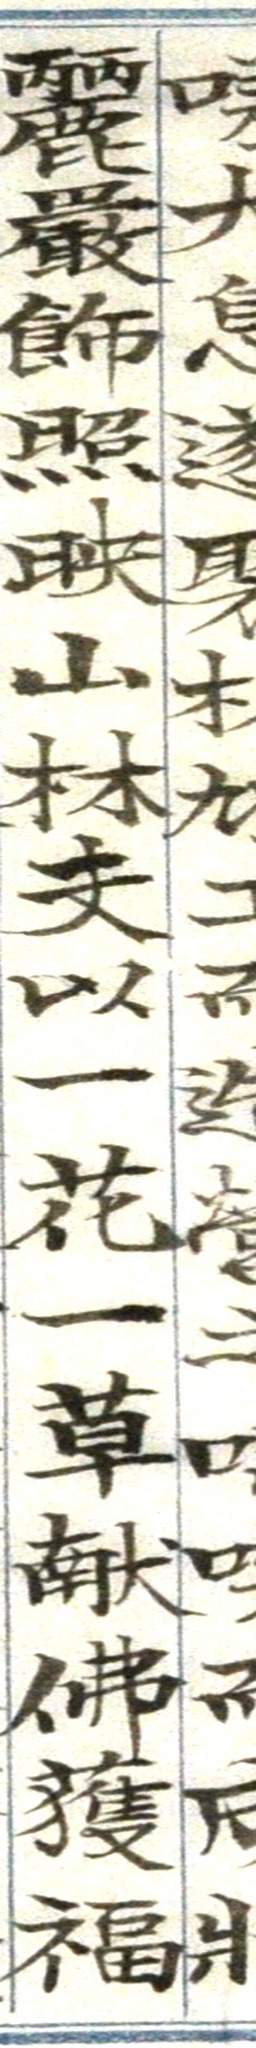麗厳飾照映山林夫以一花一草献仏獲福
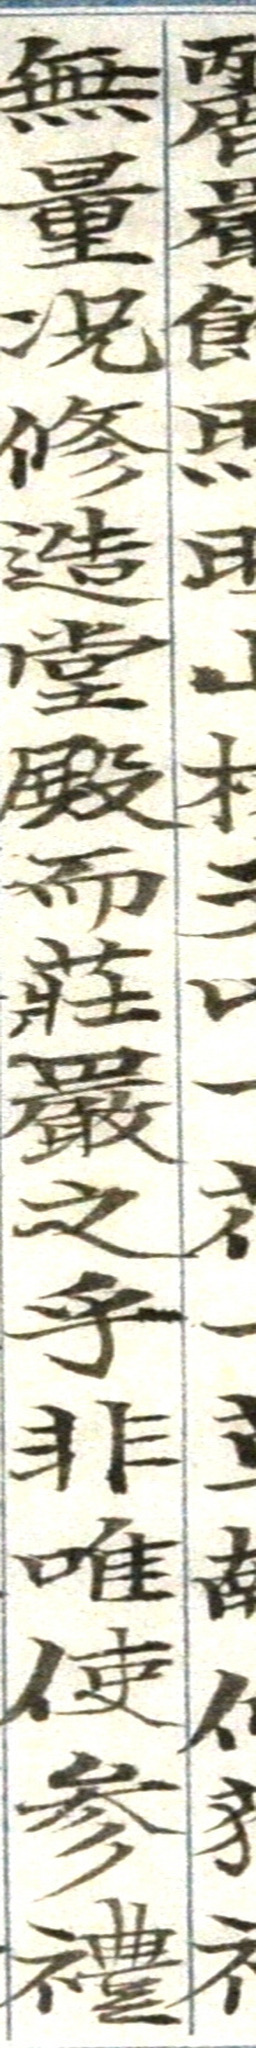無量況修造堂殿而荘厳之乎非唯使参礼
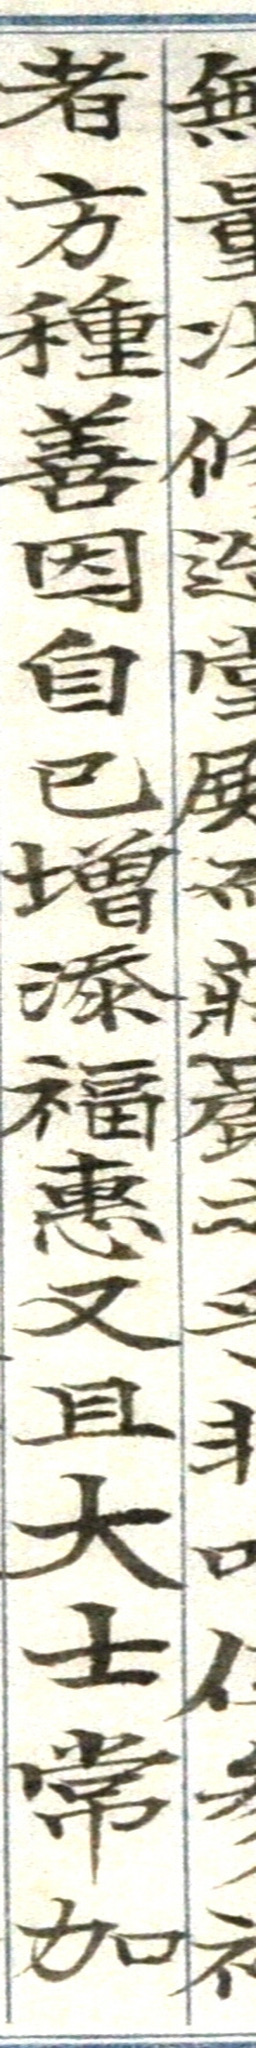者方種善因自已増忝福恵又且大士常加
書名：桂泉院・樹林寺・東光寺縁起書、蓮華寺由来書、付夕顔観音記
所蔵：伊那市立高遠町図書館・合同会社AMANE
